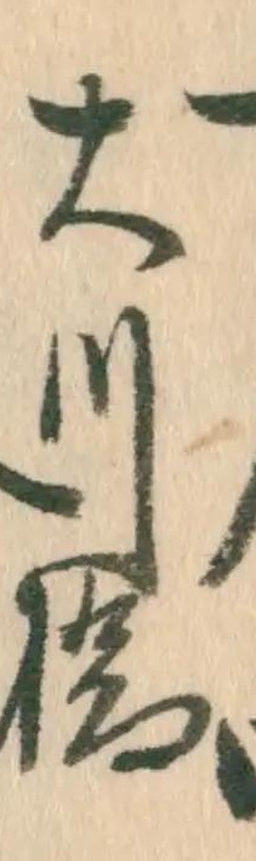大川橋
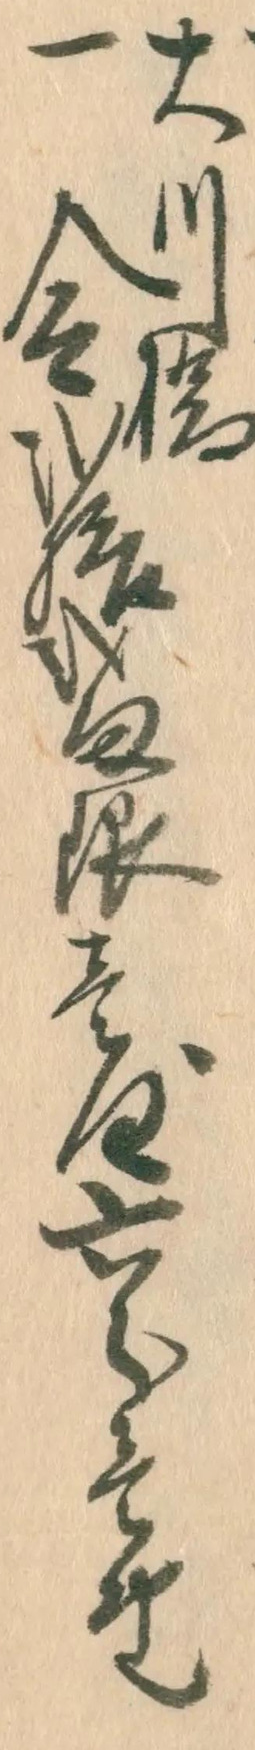一金弐拾弐両銀壱匁六分壱厘

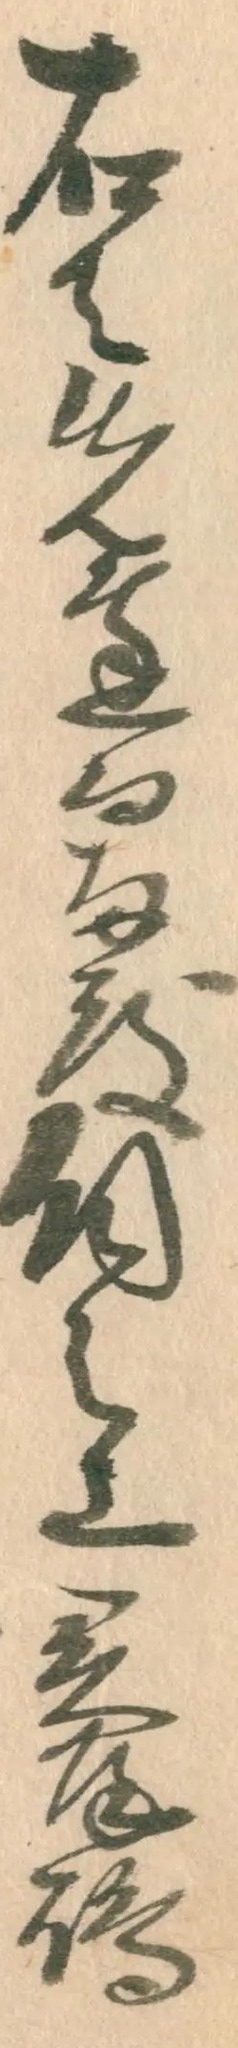右は先達而両度伺之上霊岸島
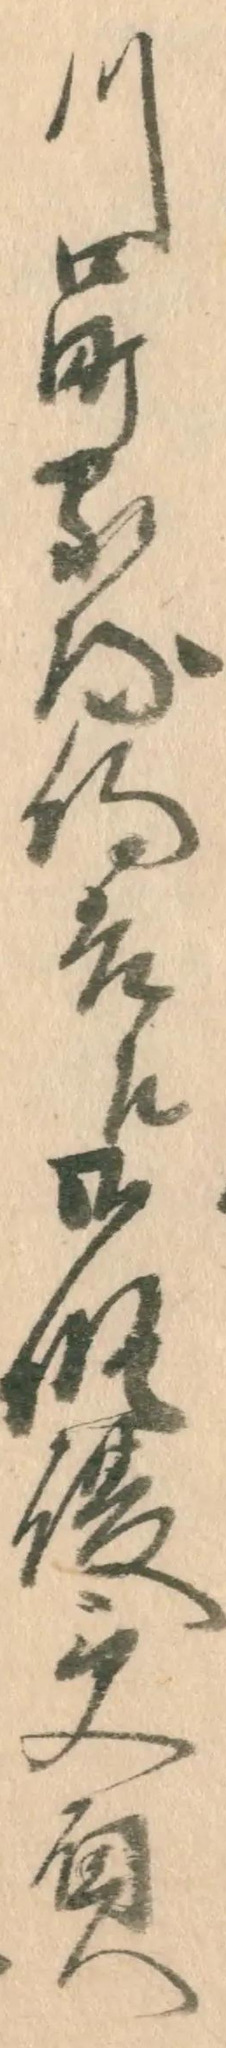川口町家持伝吉え御修復受負
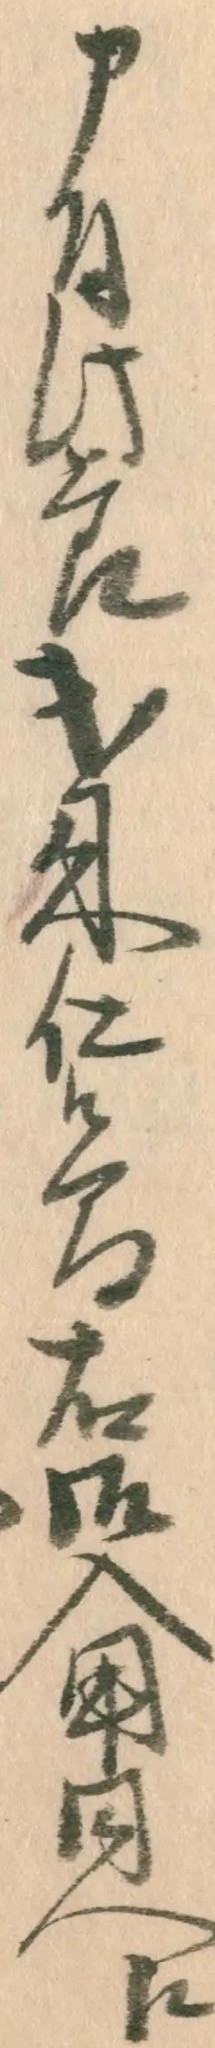申付此節出来仕候間右御入用同人え
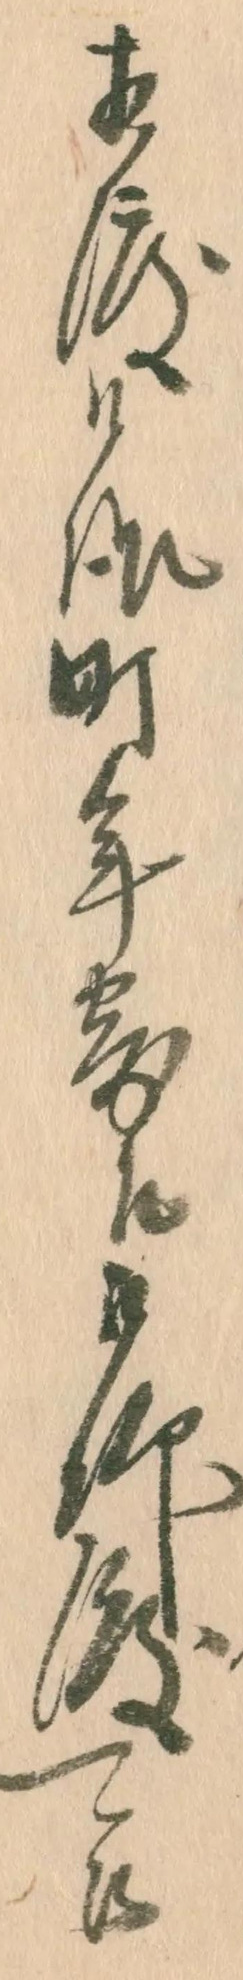相渡候様町年寄え被仰渡可被
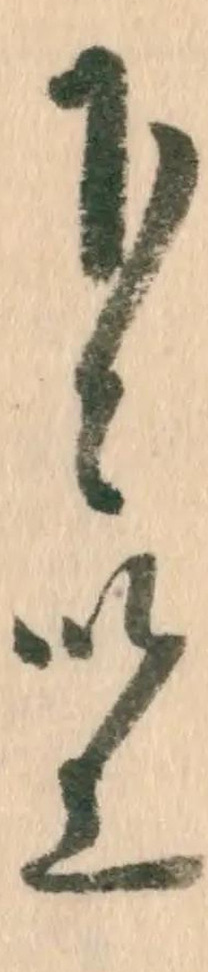下候以上
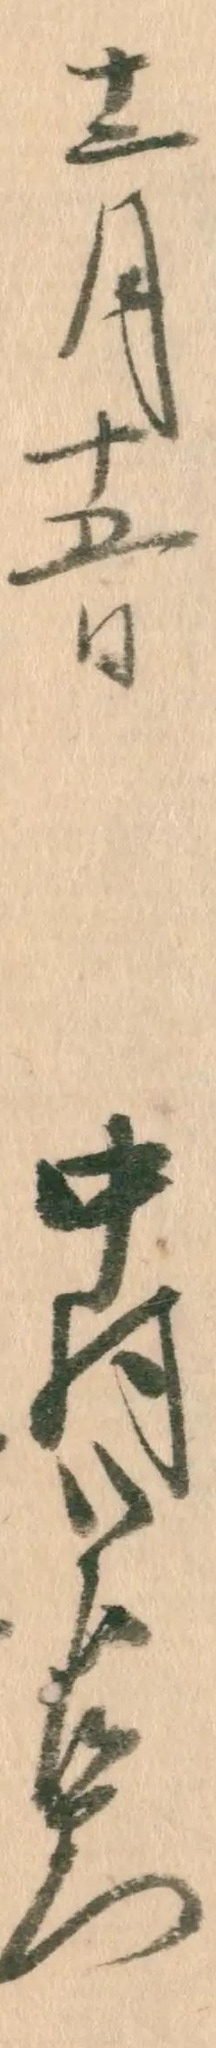十二月十五日中村八郎左衛門
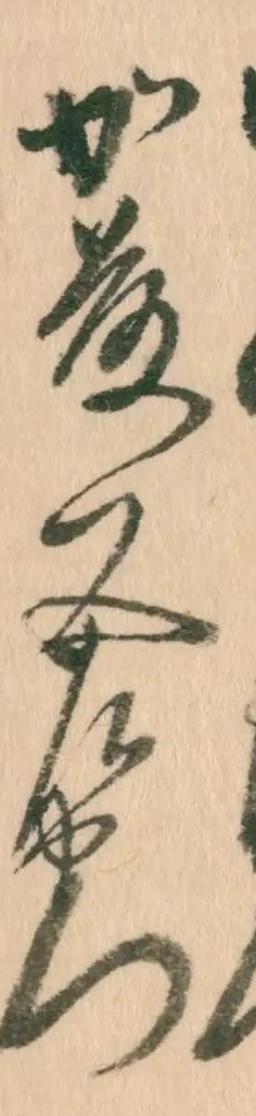加藤又左衛門
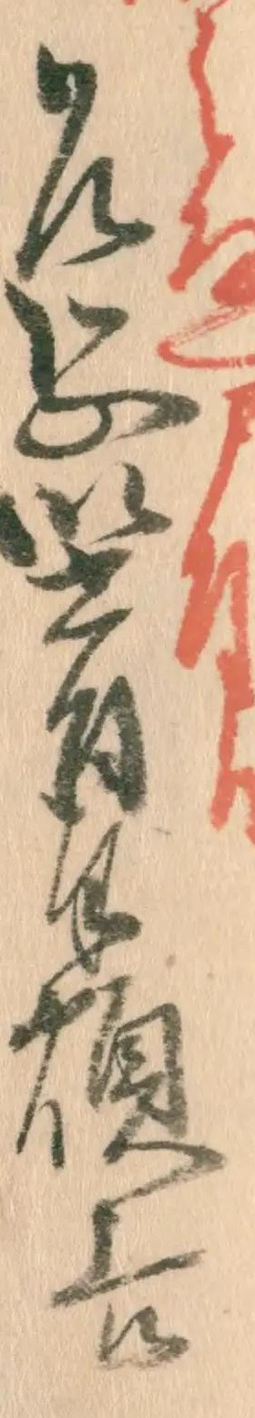乍恐以書付奉願上候
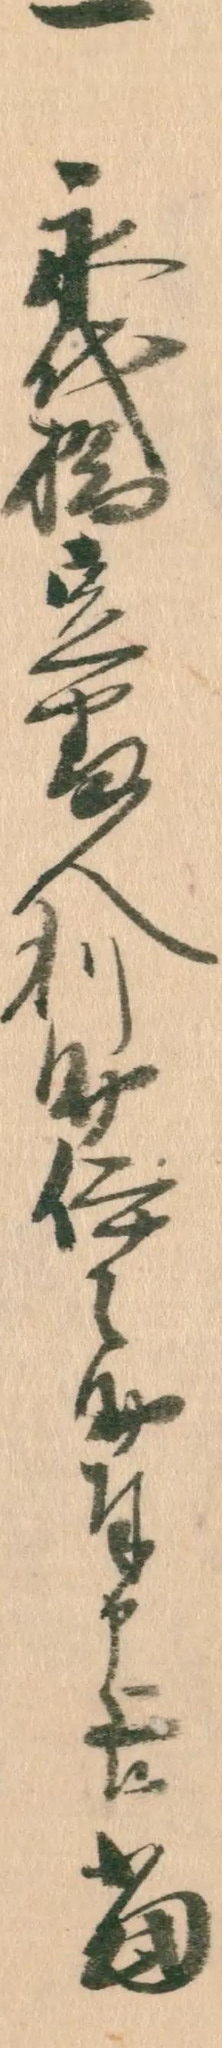一永代橋定番人利助伊之助奉申上候当
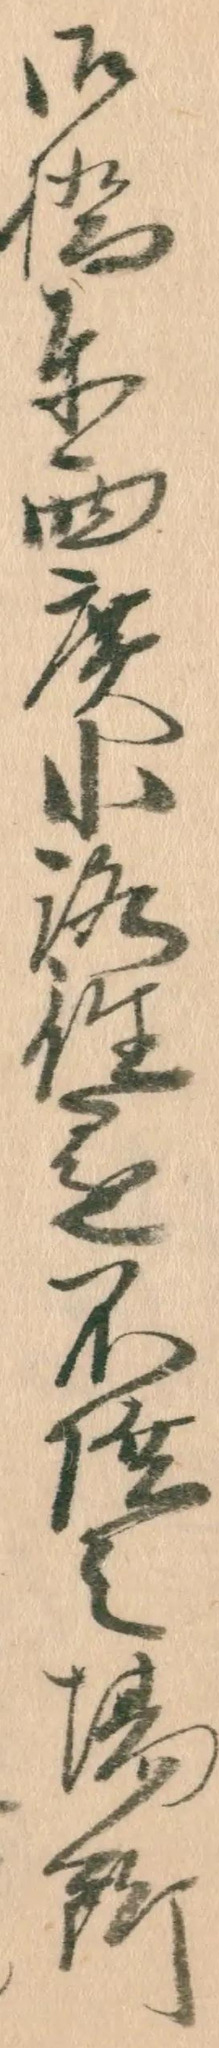御橋東西広小路往還不陸之場所
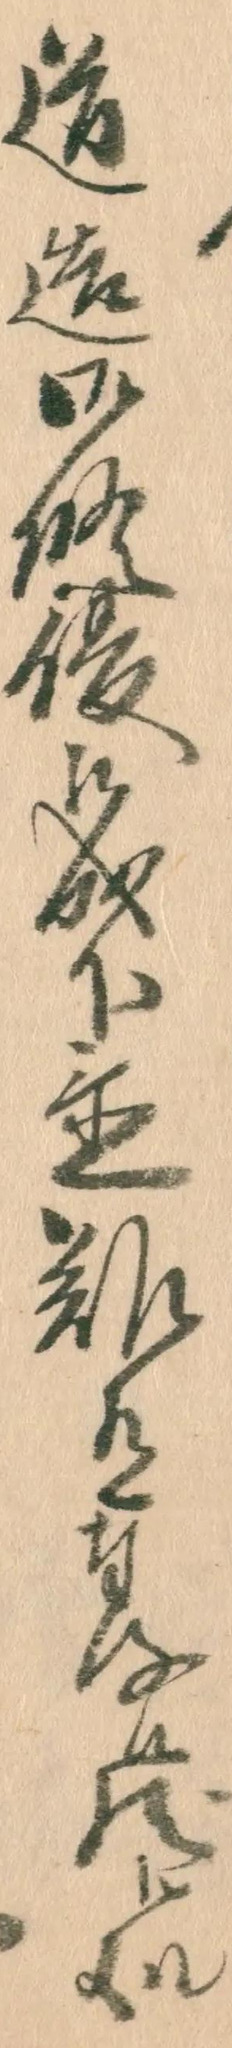道造御修復被成下置難有奉存候然ル処
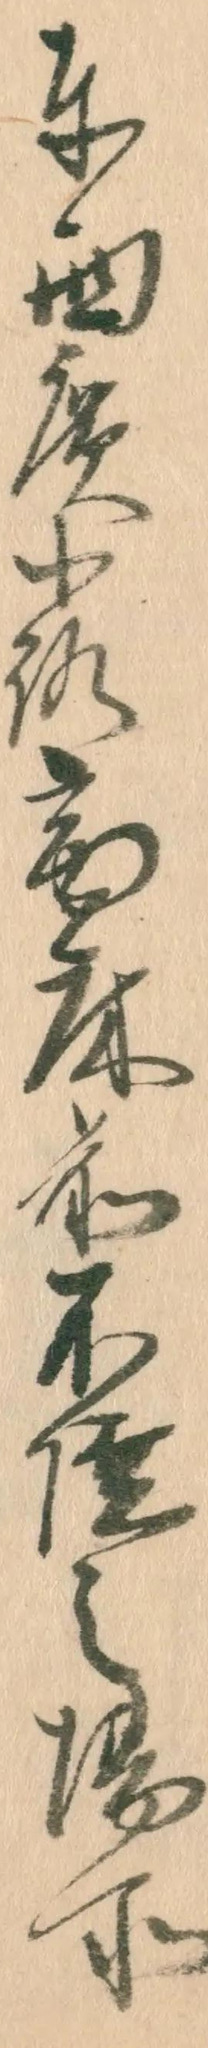東西広小路商床前不陸之場所
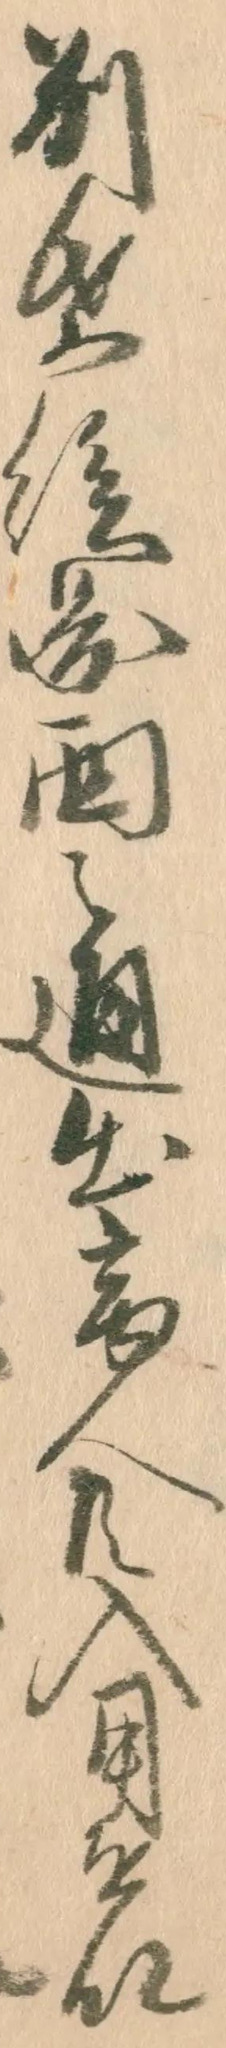別紙絵図面之通出商人共入用を以
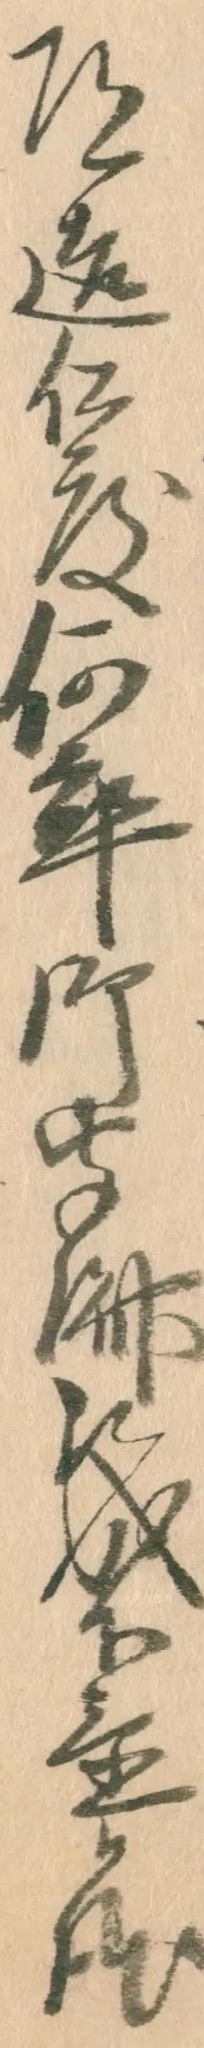道造仕度何卒御聞済被成下置候様
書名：三橋 17巻. [7] 三橋小破御修復書留　但御奉行御掛リ替地震潰橋番屋　嘉永四亥年より安政二卯年迄　上
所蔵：国立国会図書館 National Diet Library, JAPAN
